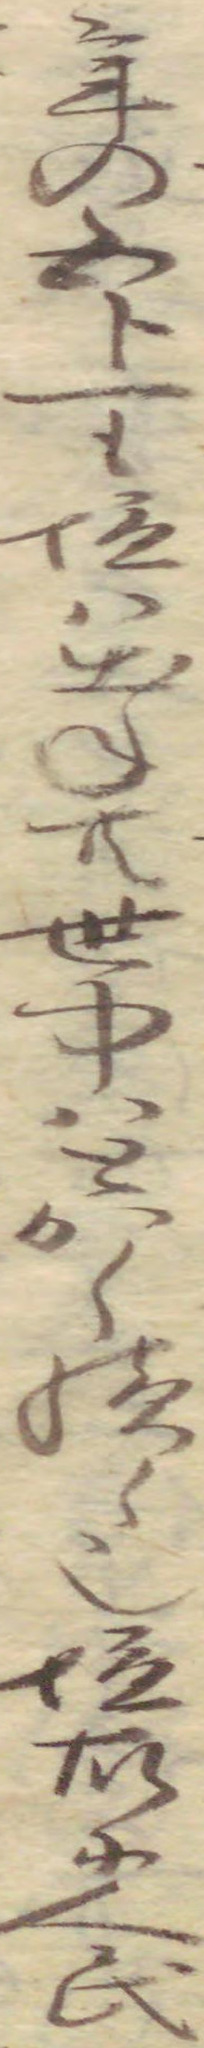年の五分一も塩は出ね共世中はとかく続く也塩故に人民
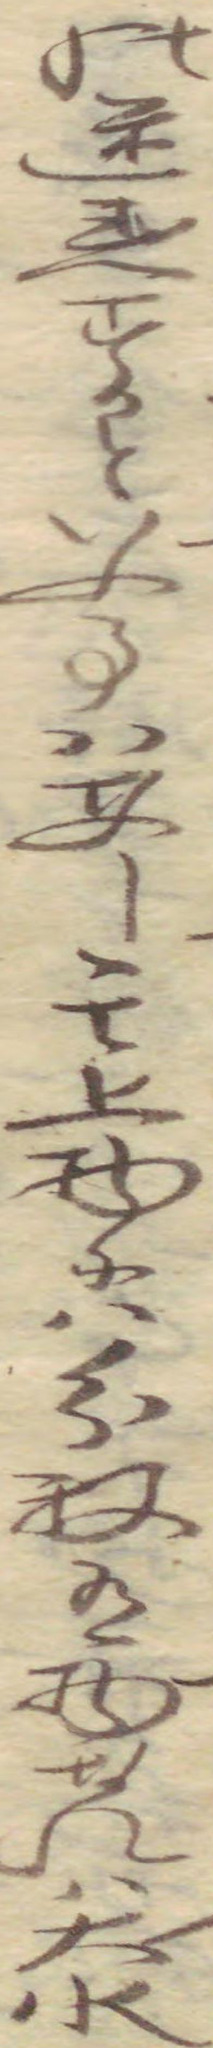の迷惑するといふ事はなし其上物には分数有物なれは大水
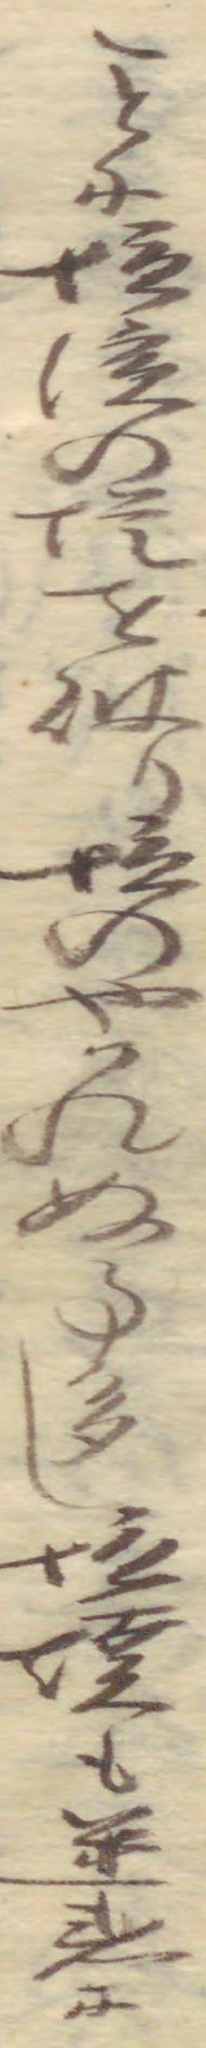ことに塩浜の堤を破り塩のやかれぬ事多し塩焼も迷惑に
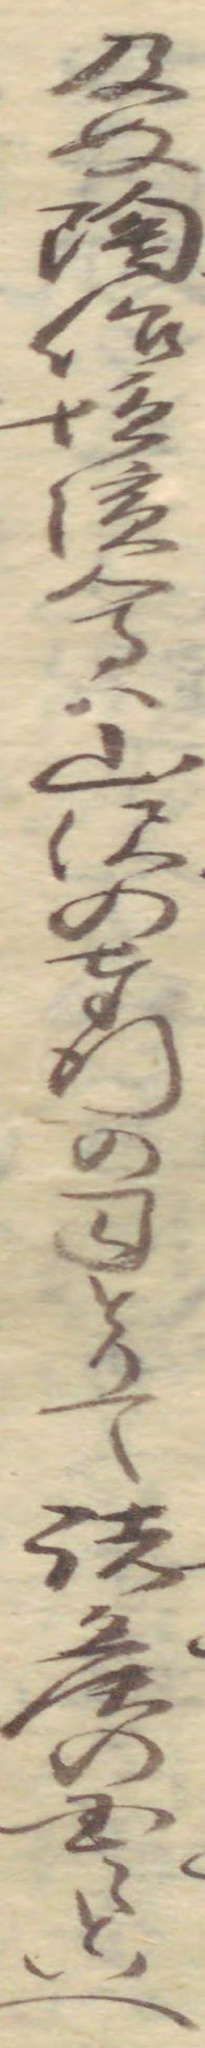及ぬ陶作塩浜等は山沢の奉行の司とりて諸侯の国〻といへ
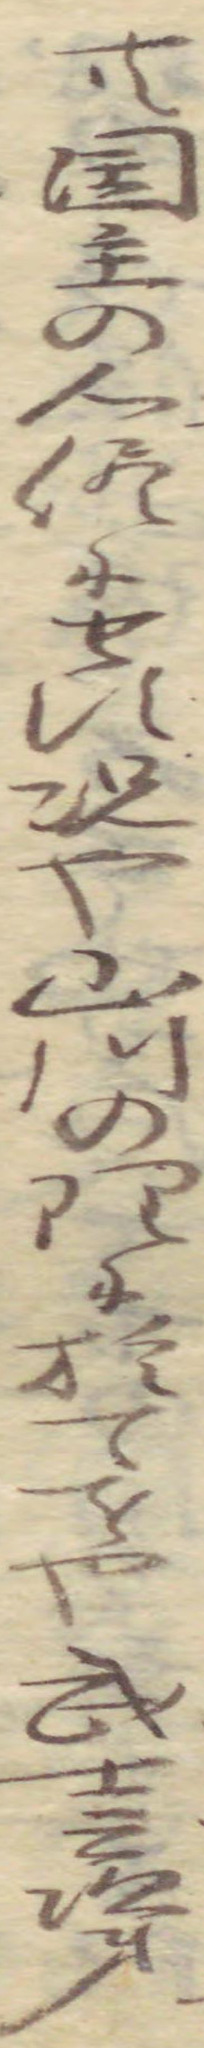共国主の心侭にせす況や山川の理に於てをや武士云次第
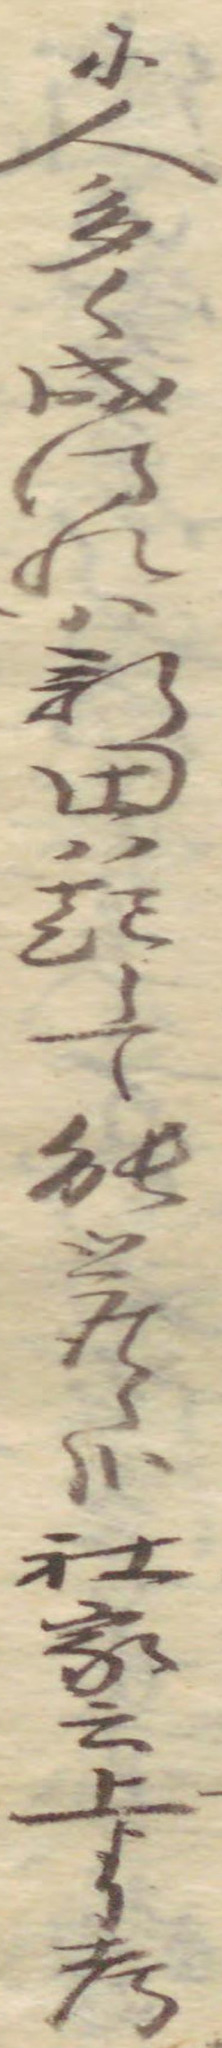に人多く成侍れは新田は起して能御座候哉社家云上より考
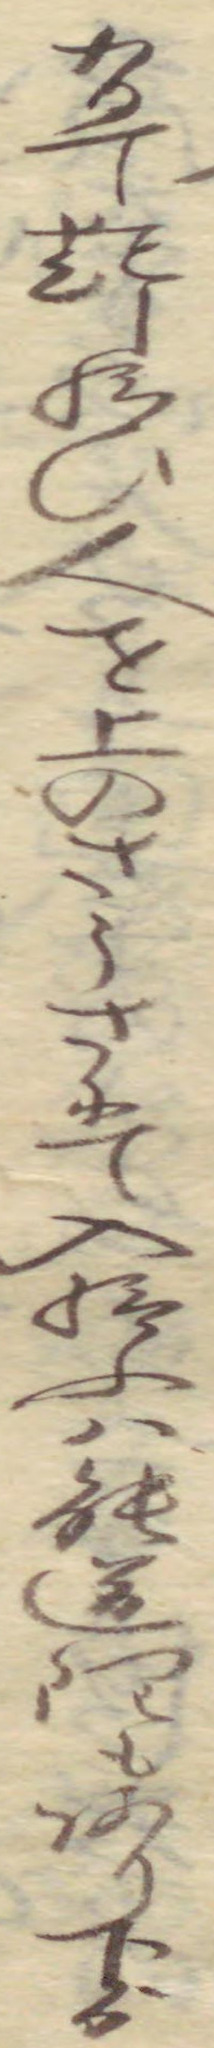有て起し給ひ人を上のさうさにて入給ふは能道理もあり下ゟ
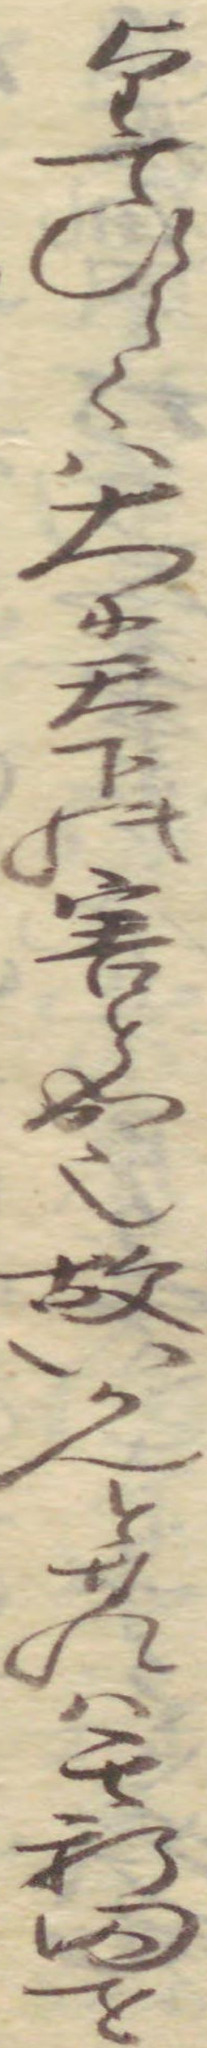望てひらくは大に天下の害と成也故いかんとなれは其新田を
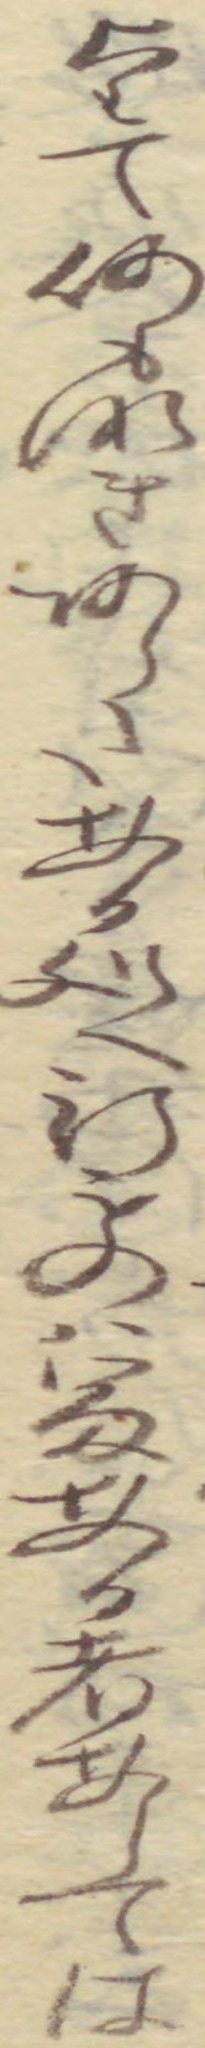望て何もなきあらたなる処へ行ものは富なる者ならては
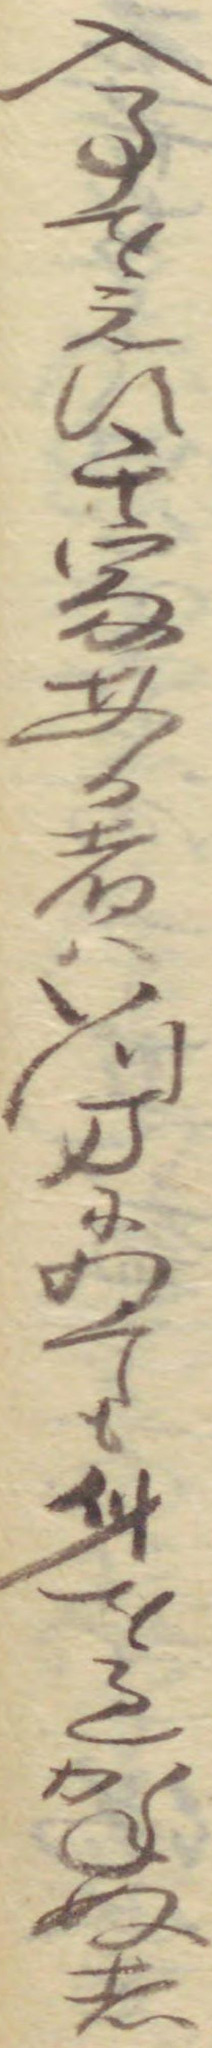入事をえす其富なる者はいつ方にゐても身を過かねぬ者
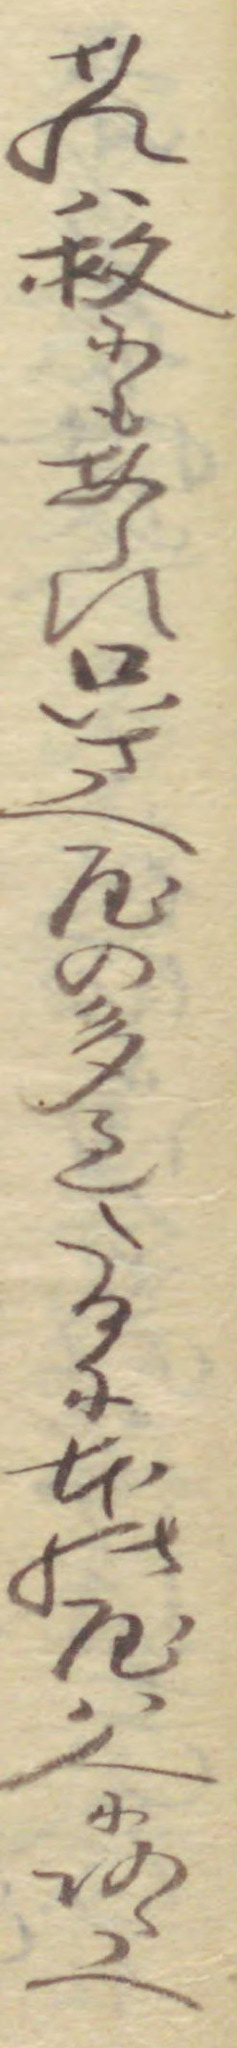なれは救にもならす只さへ屋の多過たるに本の屋は人にあたへ
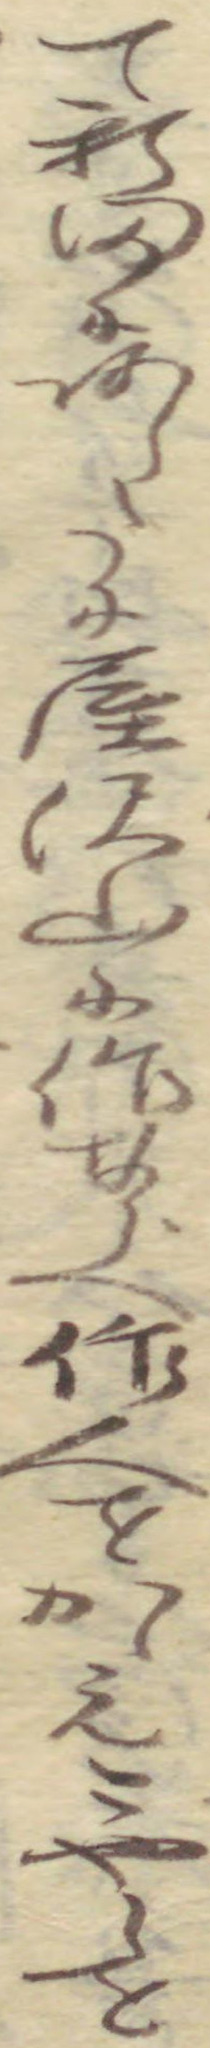て新田にあらたに屋沢山に作ならへ作人をかゝえこやしを
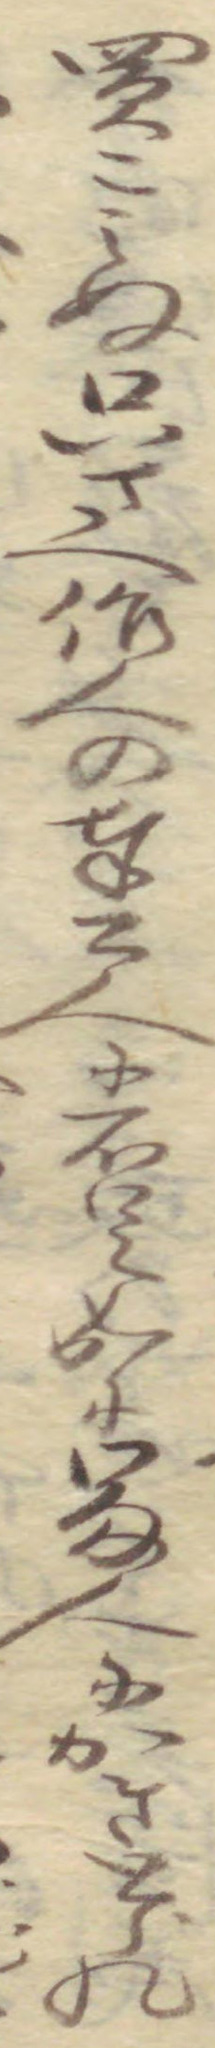買こみぬ只さへ作人の奉公人に不足成に富人にかきとられ
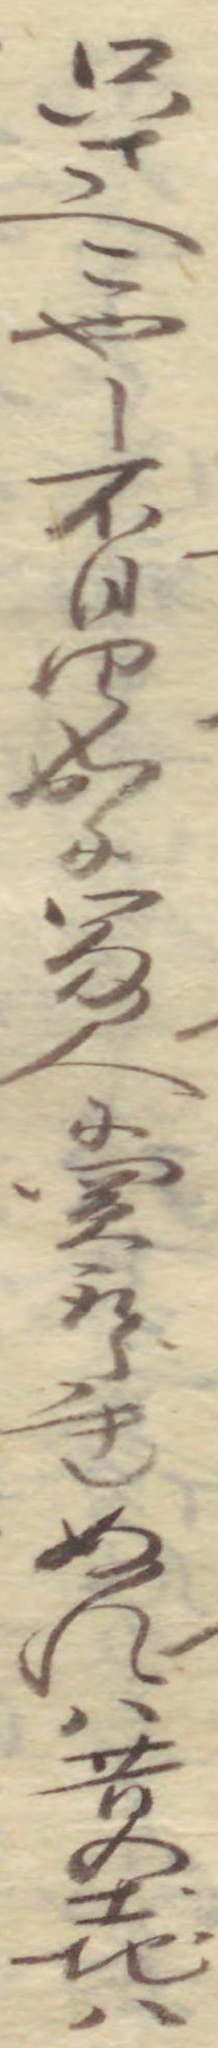只さへこやし不自由成に富人に買取られぬれは昔の土地は
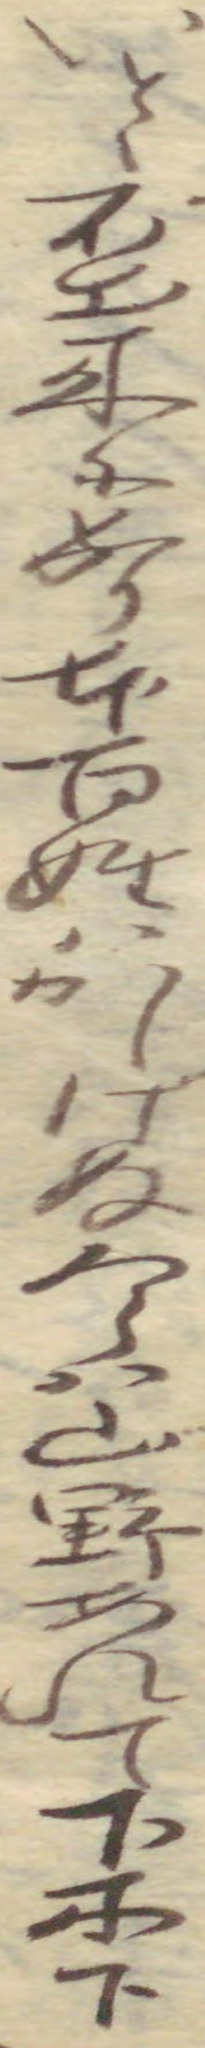いとゝ不出来に成り本百姓はかしけぬ今は山野あれて下木下
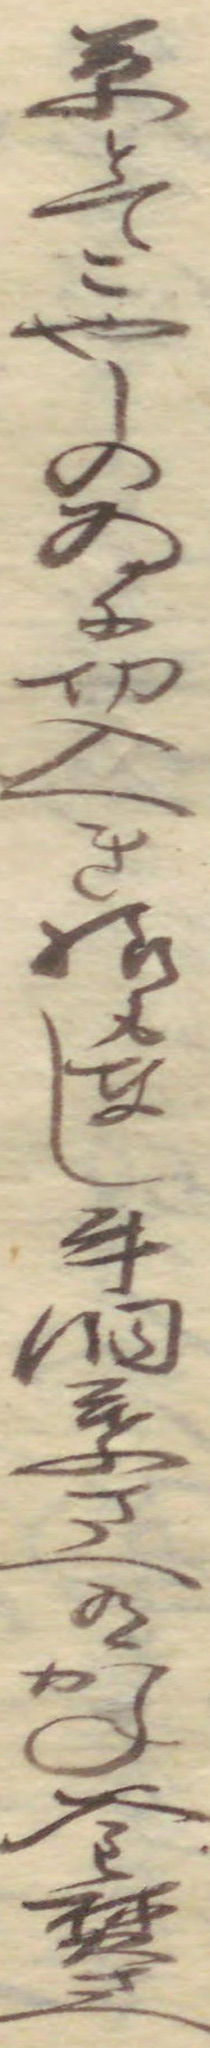草とてこやしの為に切入へき様もなし牛飼葉さへ有かね釜焚さへ
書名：鶯宿雑記. 巻263-264
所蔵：国立国会図書館 National Diet Library, JAPAN
